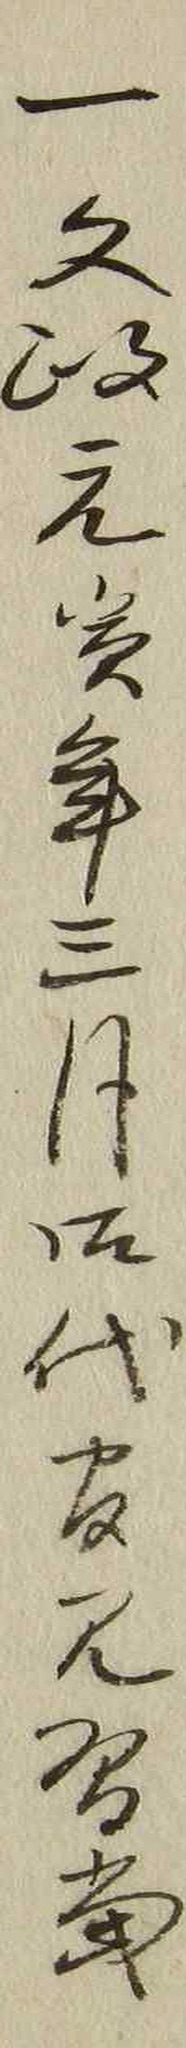一文政元寅年三月御代官見曽当
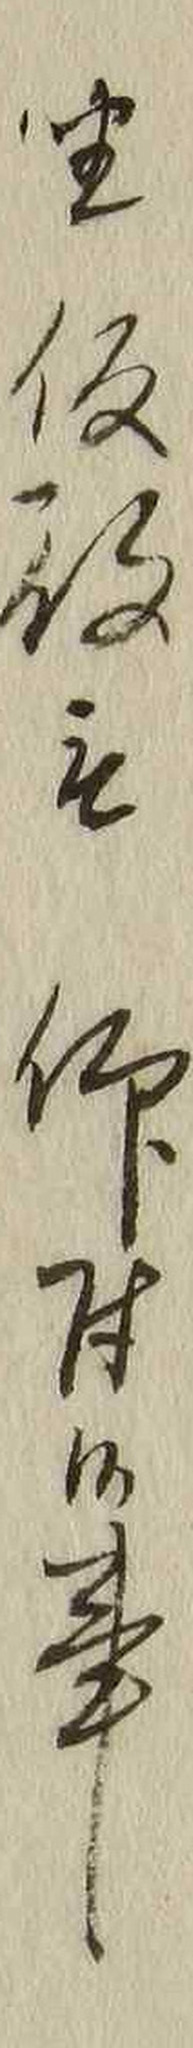坐仮役被仰付候事
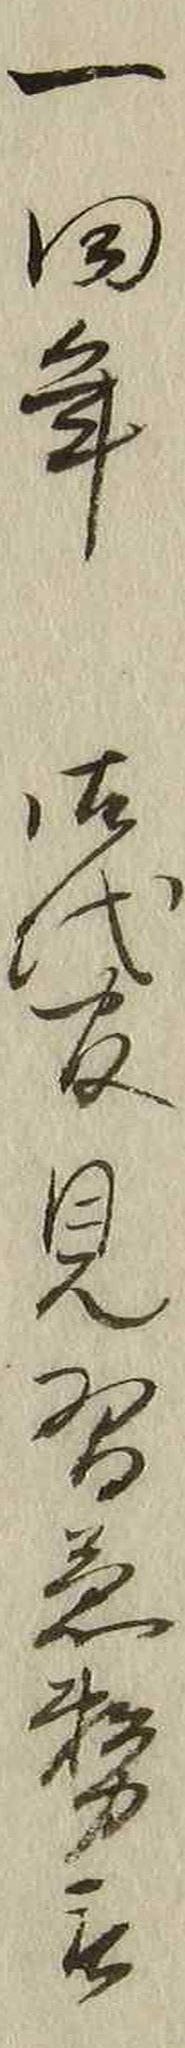一同年御代官見習兼務被
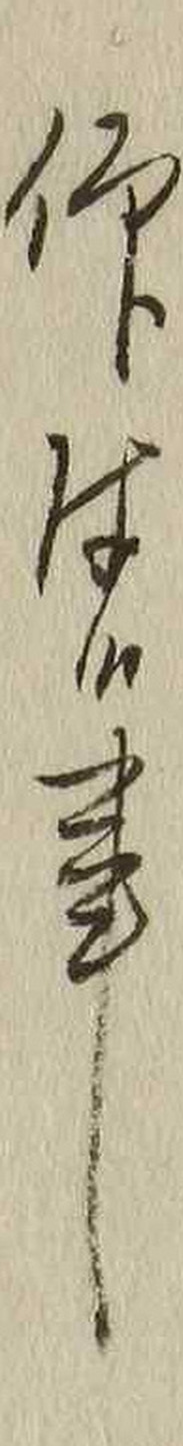仰付候事
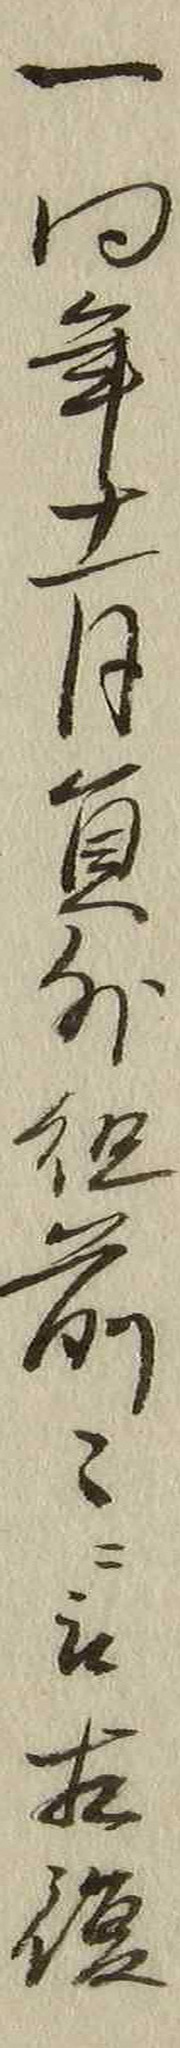一同年十一月員外組前々ニ被相復
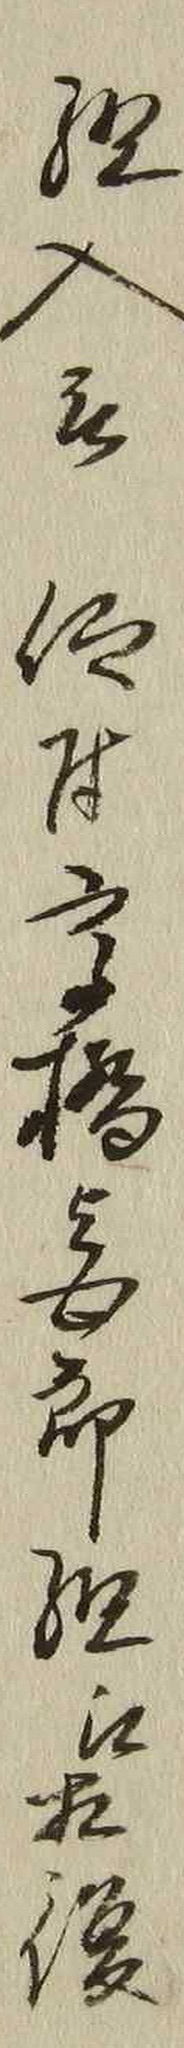組入被仰付高橋与五郎組江相復
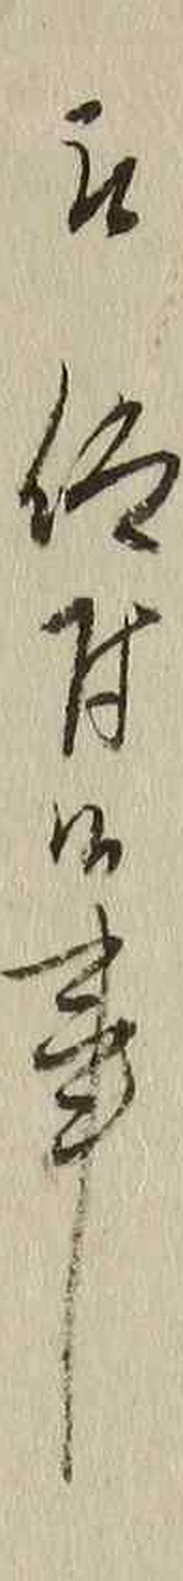被仰付候事
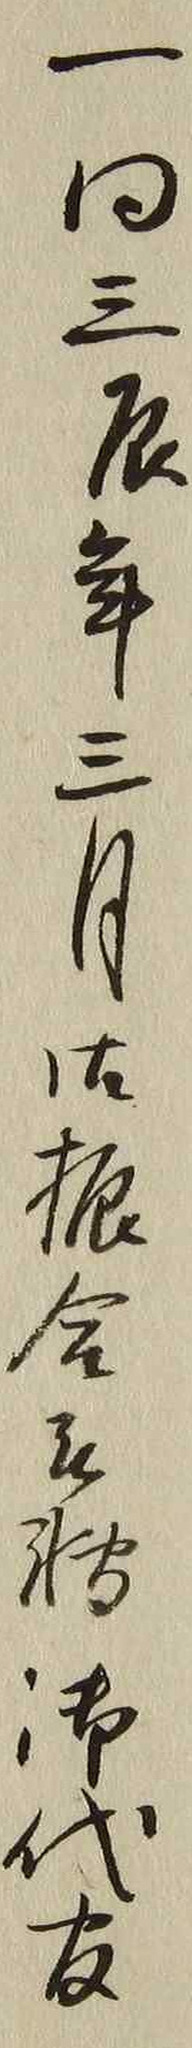一同三辰年三月御振合被転御代官
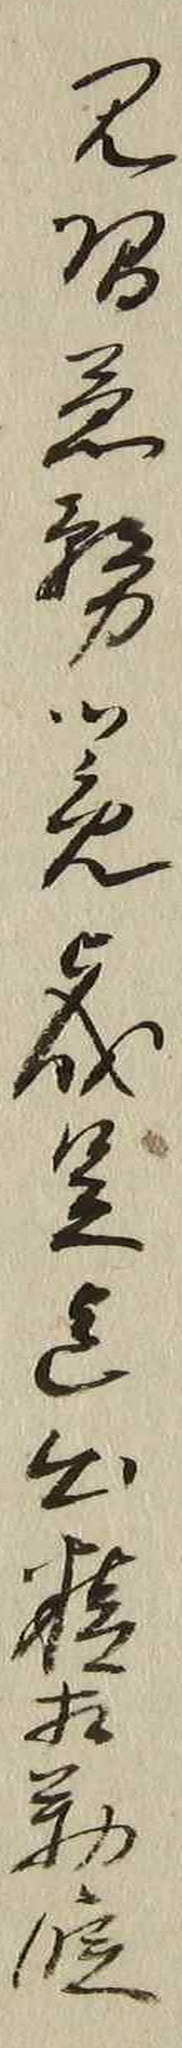見習兼務御免被成是迄出精相勤候段
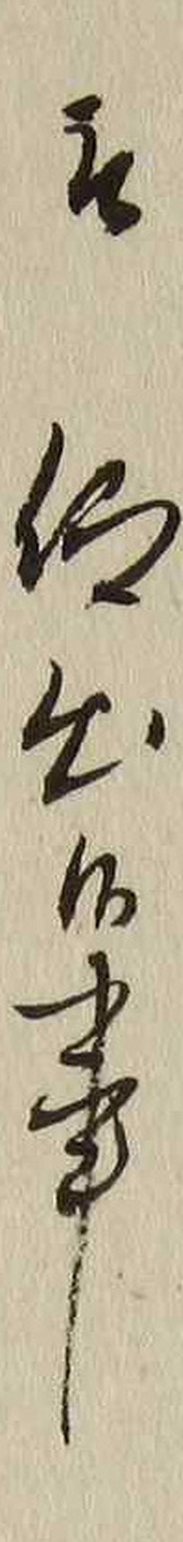被仰出候事
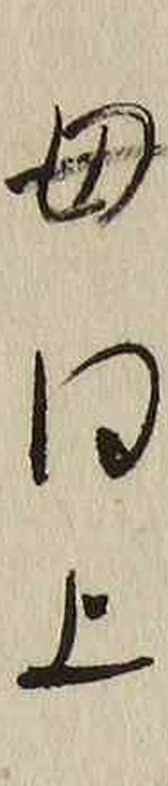母同上
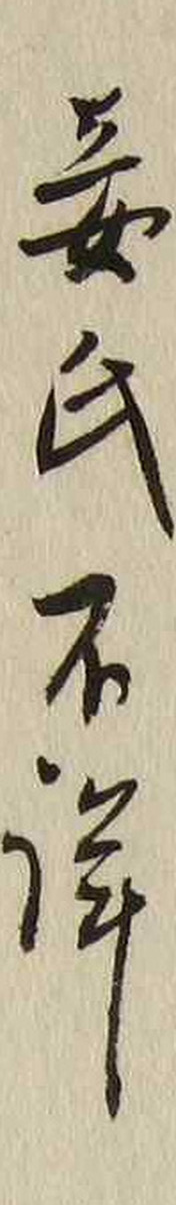妄氏不詳

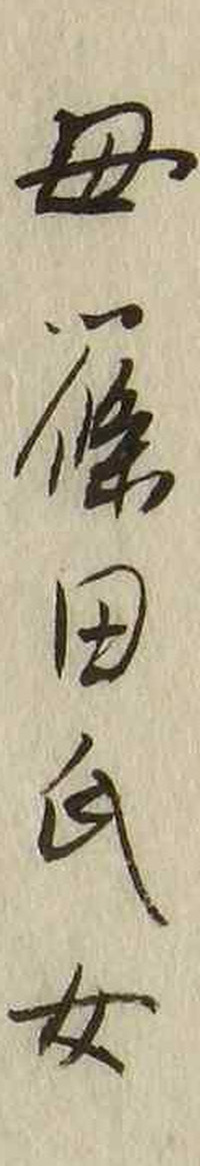母篠田氏女
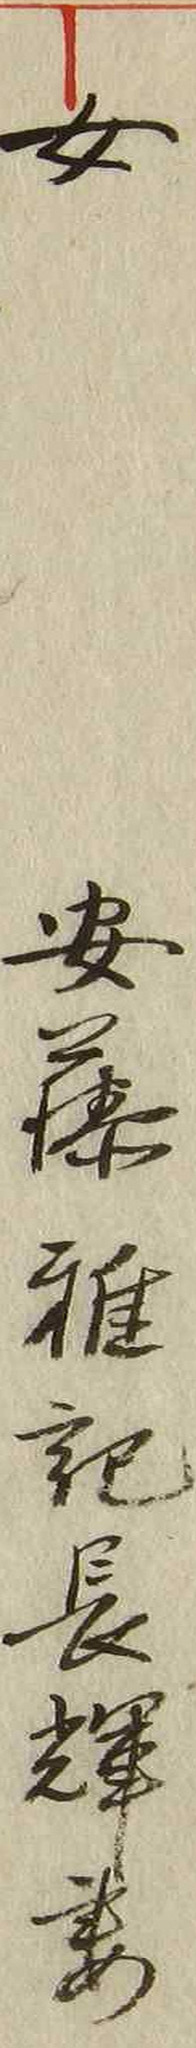女安藤雅記長輝妻
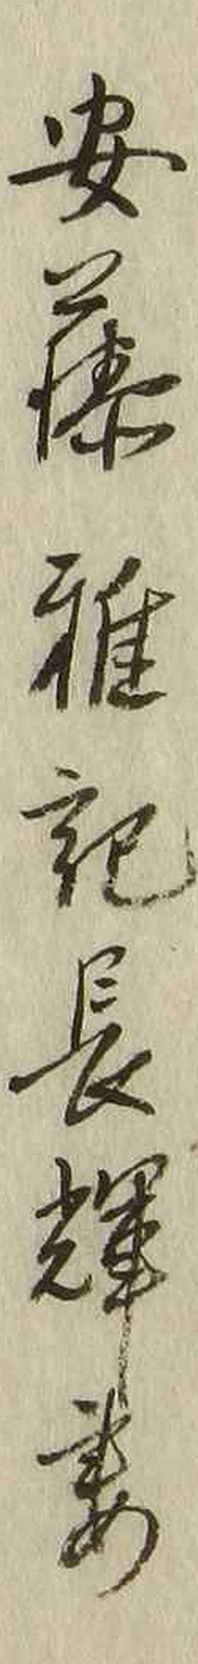女安藤雅記長輝妻
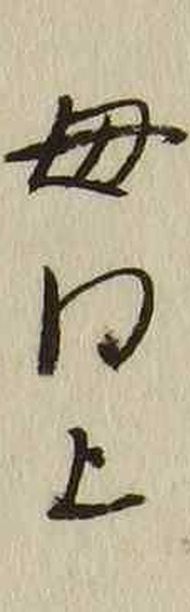母同上
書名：諸士系譜　巻之359　す之部9
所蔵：会津若松市立会津図書館
